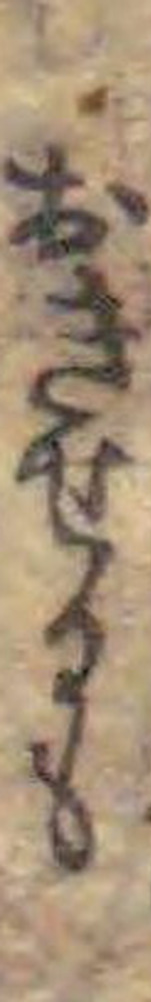おきせるも
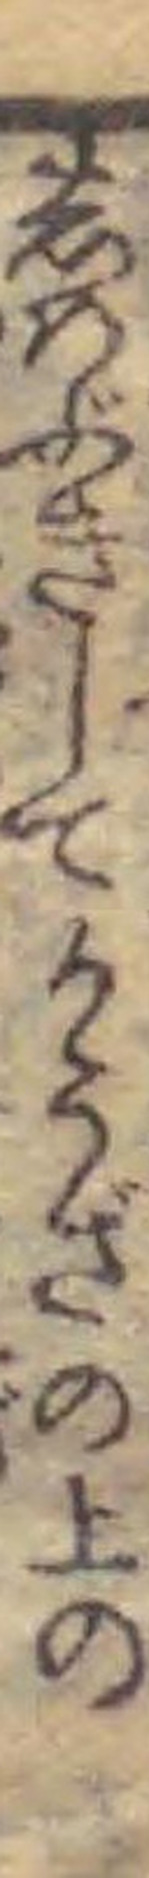しはぶきしてかうざの上の
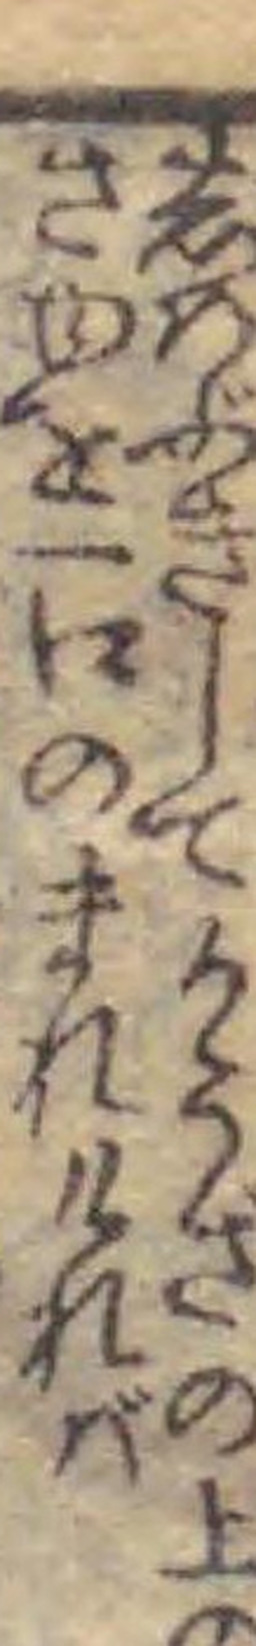さゆを一口のまれければ
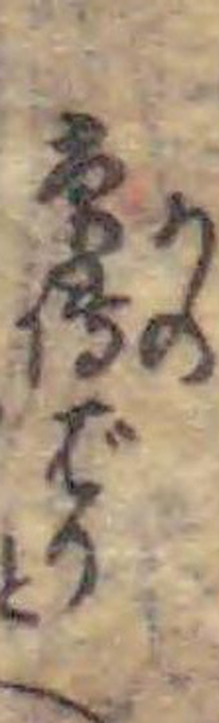京伝ばりと
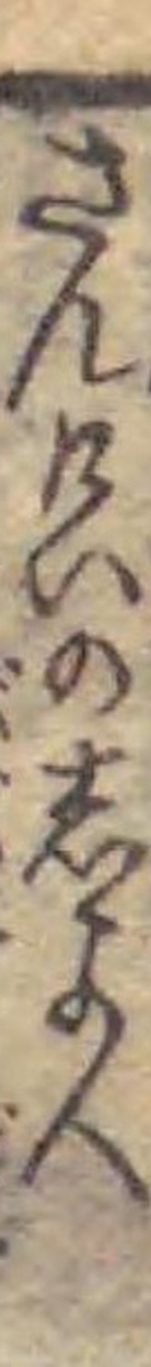さんけいのしよ人
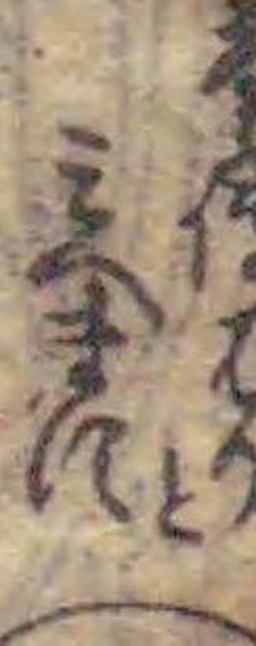みへます
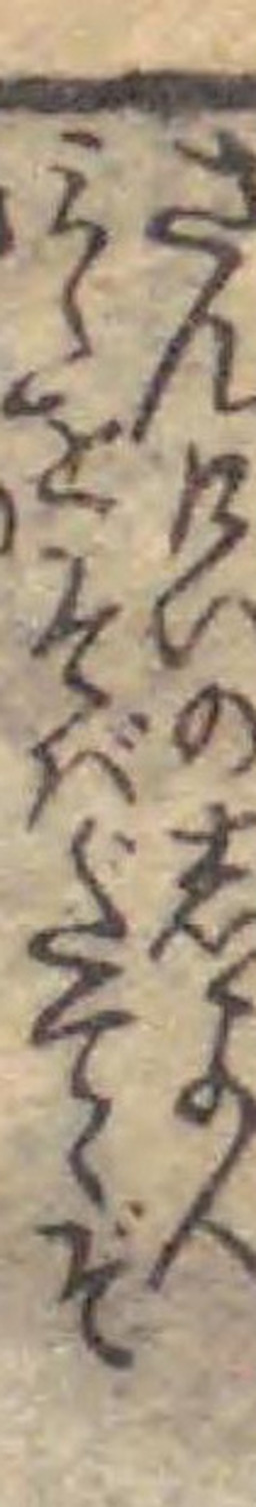みゝをそばだてゝぞ
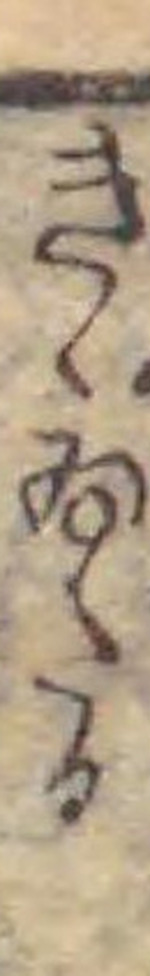きゝゐたる
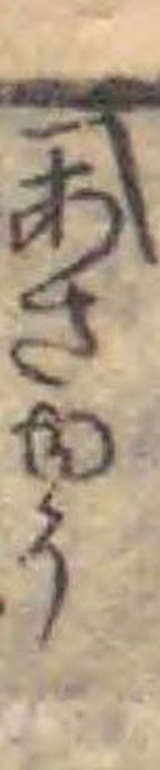〽あさゆう
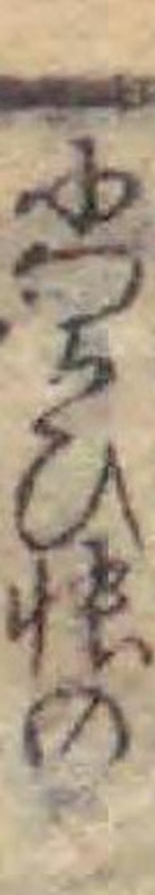ふつかひ帳の
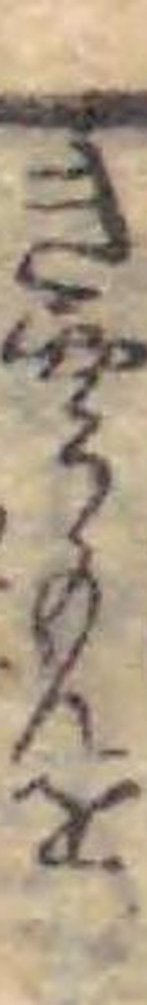きやうもんを
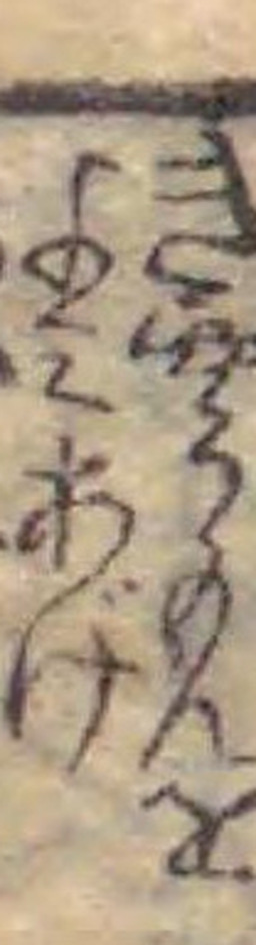よみあげ
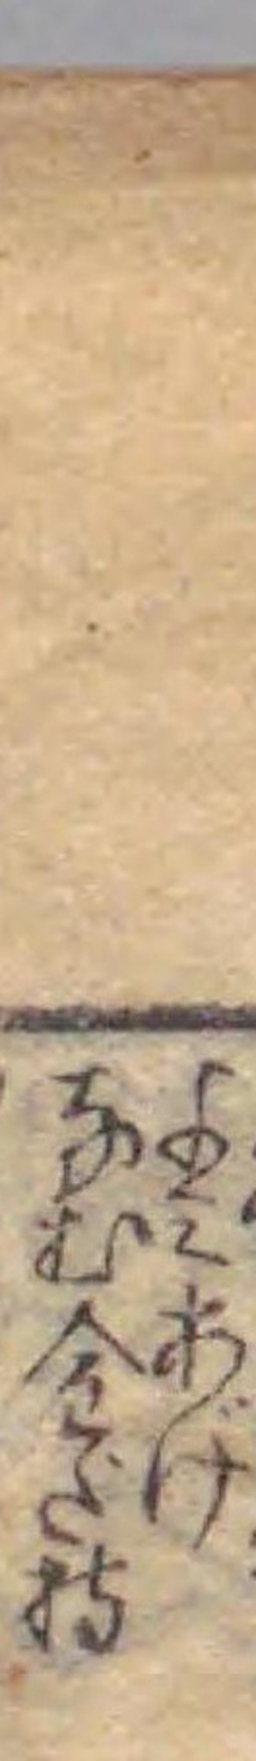なむ金だ持
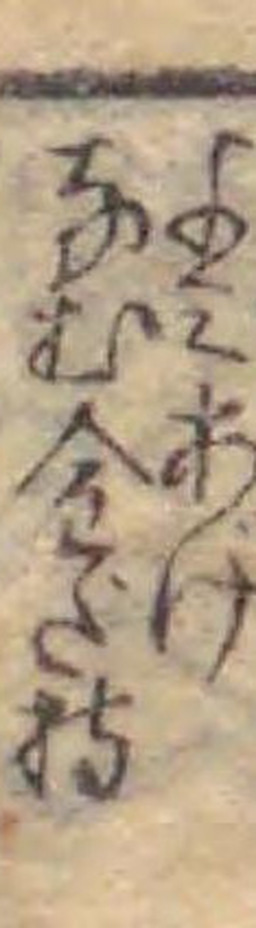なむ金だ持
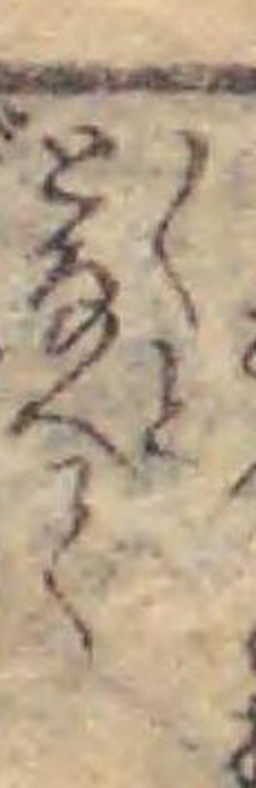となへて
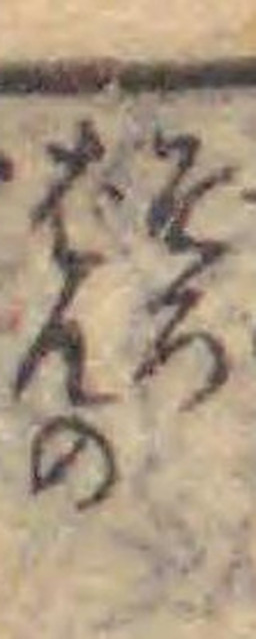ばんの
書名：身体開帳略縁起 : 3巻
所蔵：国立国会図書館 National Diet Library, JAPAN
